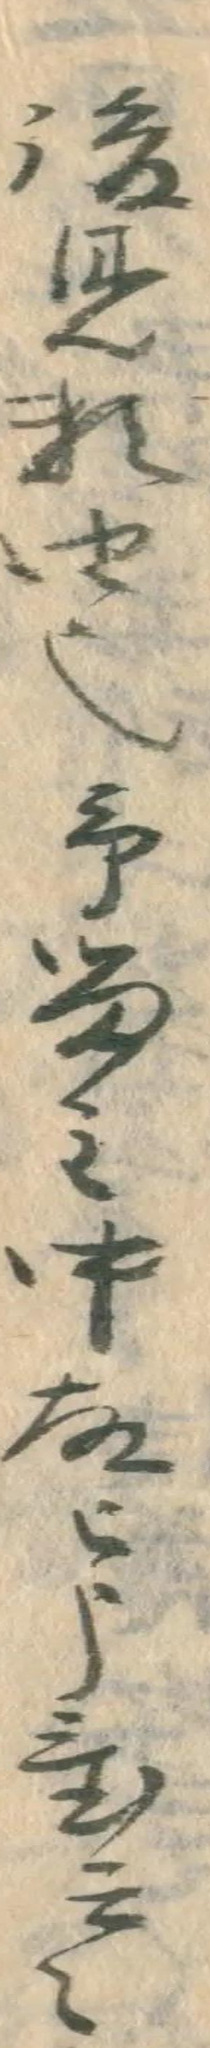後見頼由也、予留主中故、被申置云々、
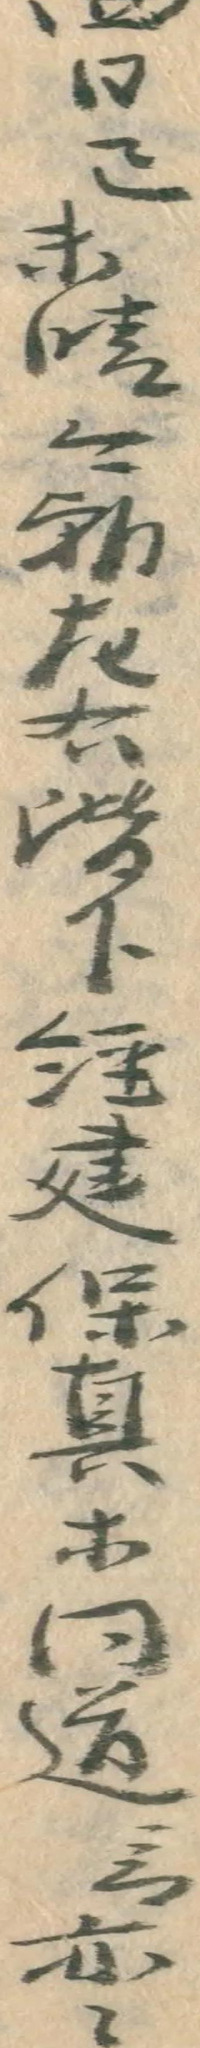四日己未晴、今朝左右階下経建・保真等同道ニ而、亦々
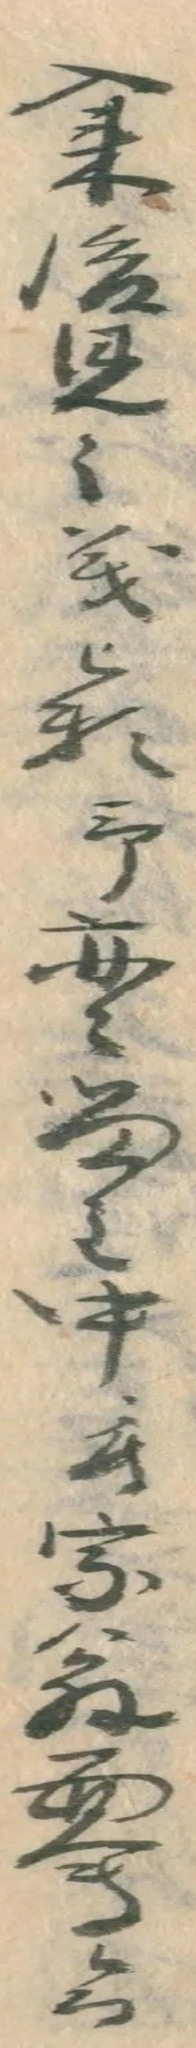入来、後見之義被頼、予亦々留守中ニ而、家翁面會候而、

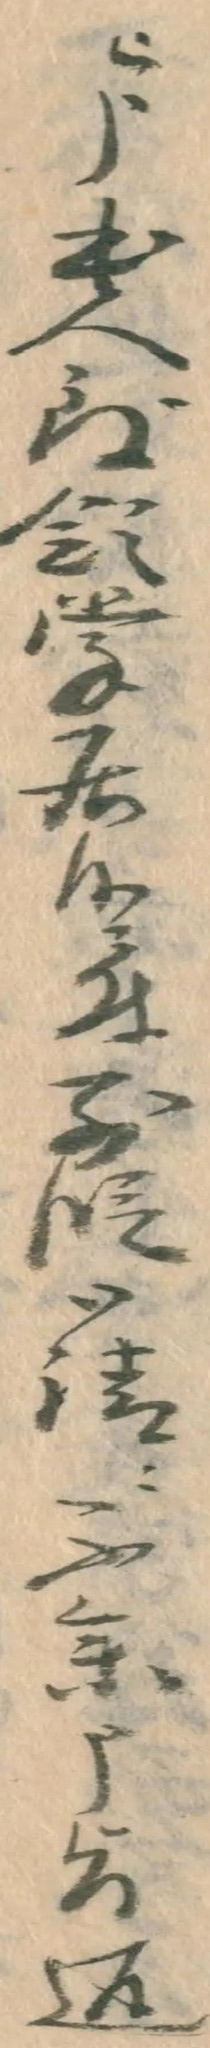被申、本人致領掌居候ニ付、別段御請ニ不参申旨返
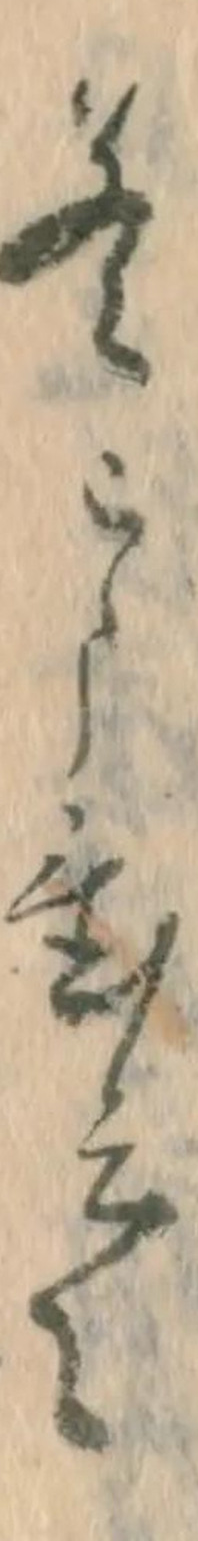答被申置候云々、
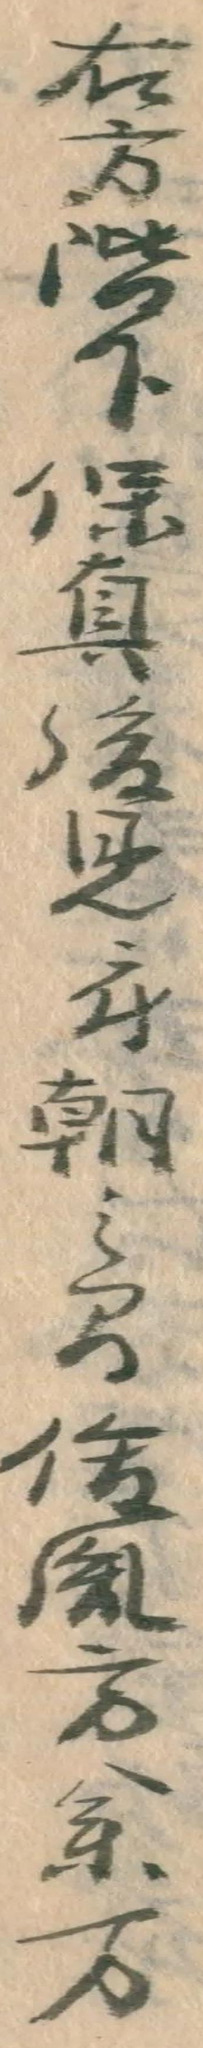右方階下保真後見ニ付、朝之間俊胤方へ参、万
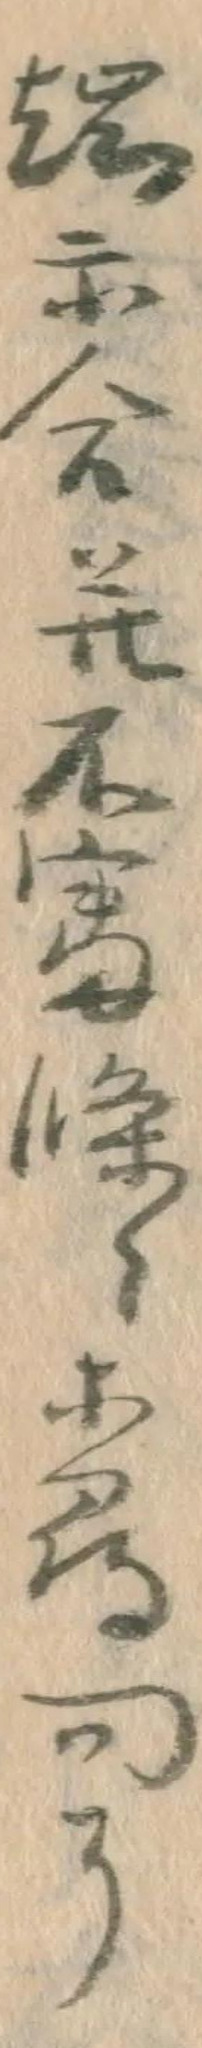端示合并不審条々等尋問了、
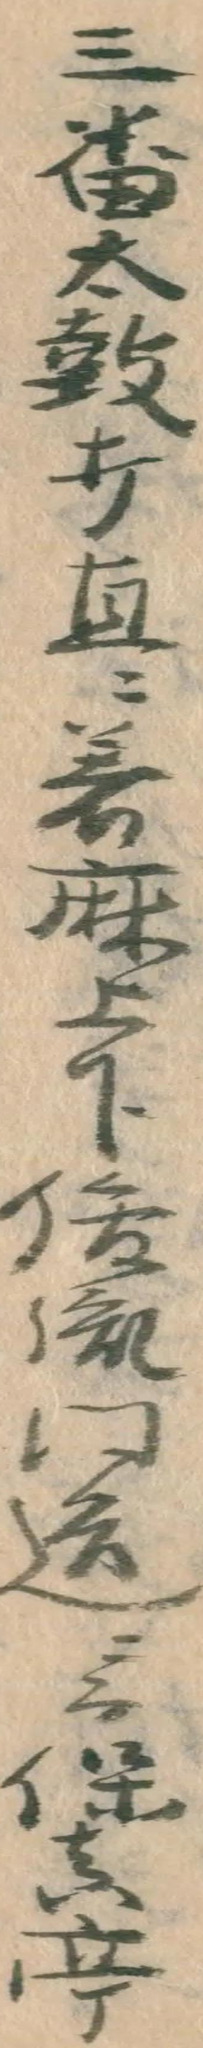三番太鼓打、直に着麻上下、俊胤同道ニ而保真亭
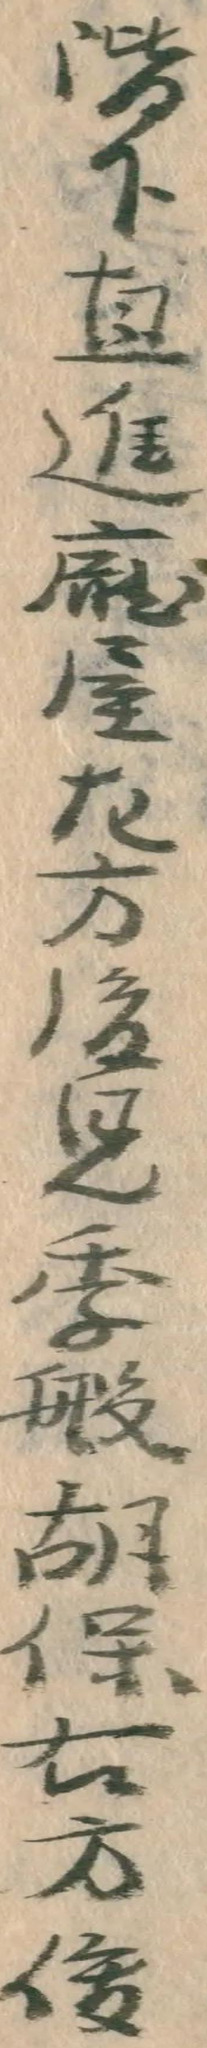階下直進廳屋、左方後見季般・胡保、右方俊
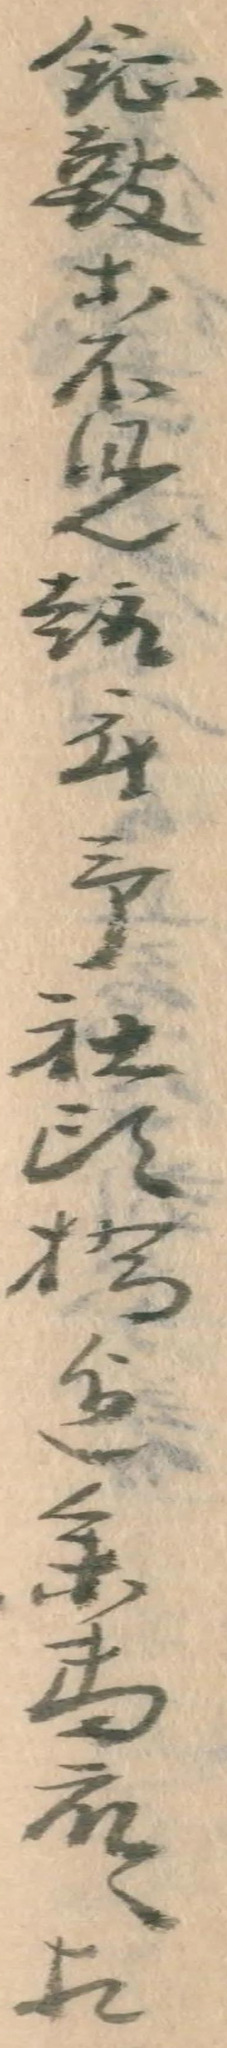鉦皷等不見趣ニ付、予社頭橋迄参、番衆へ相
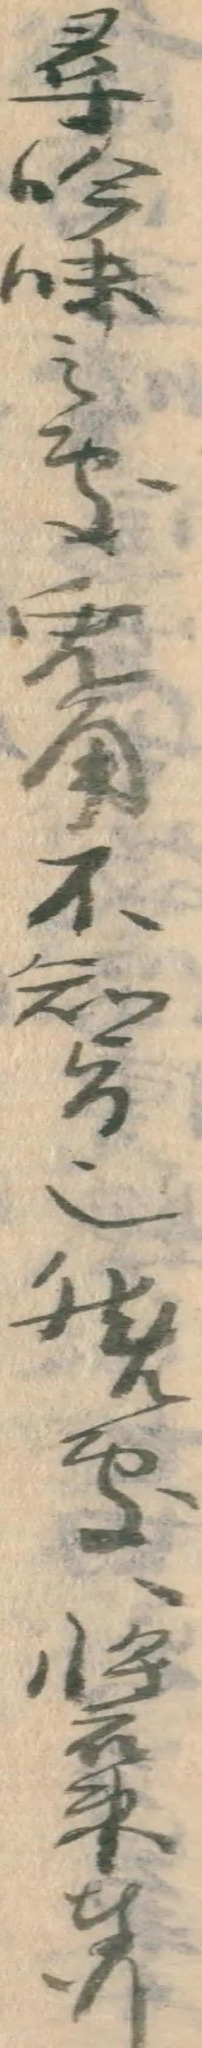尋吟味之處、兎角不知旨也、然ル處へ装束奉行
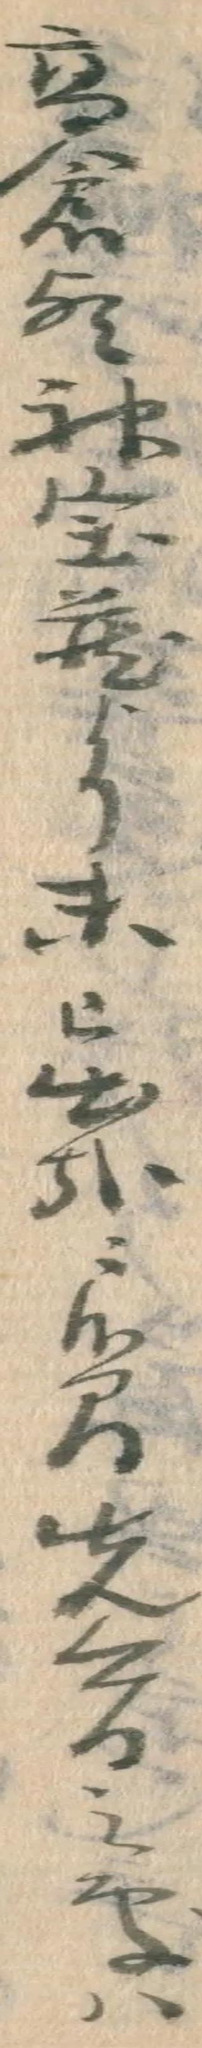高倉歟神宝蔵より末被出哉ニ候間、先今日之處ハ
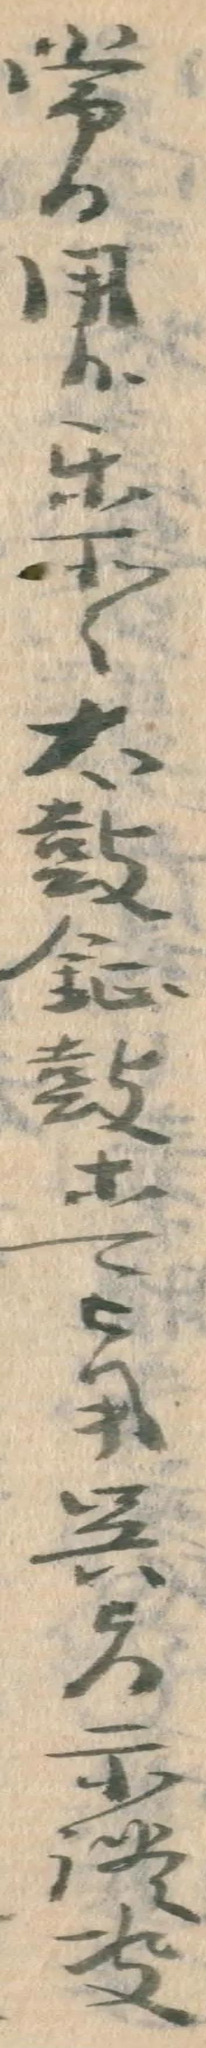常日用候、楽所之太鼓・鉦鼓等可被用呉旨示談決、
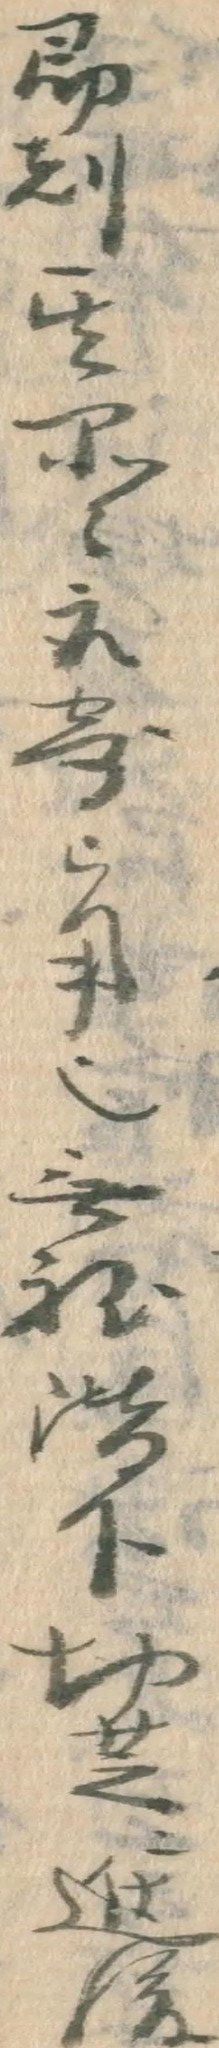即刻其品々取寄被用也、無程階下切芝二進後、
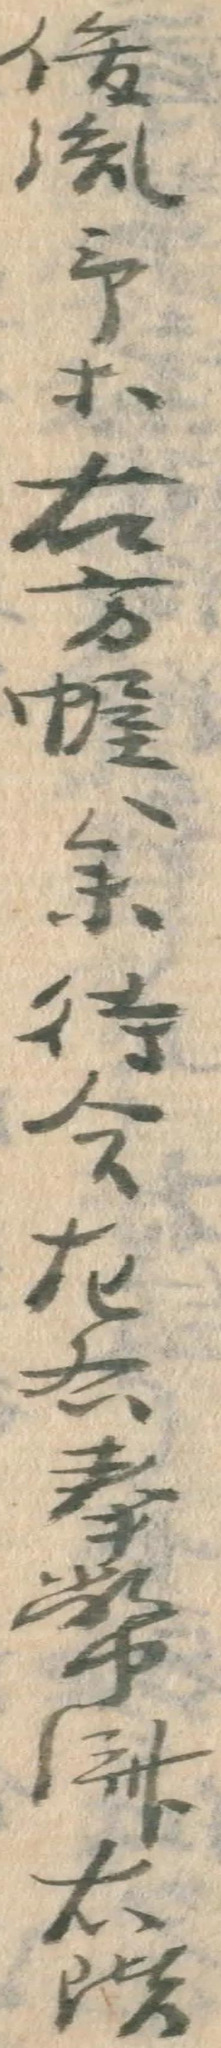俊胤予・等右方幄へ参待合、左右奉幣済、右階
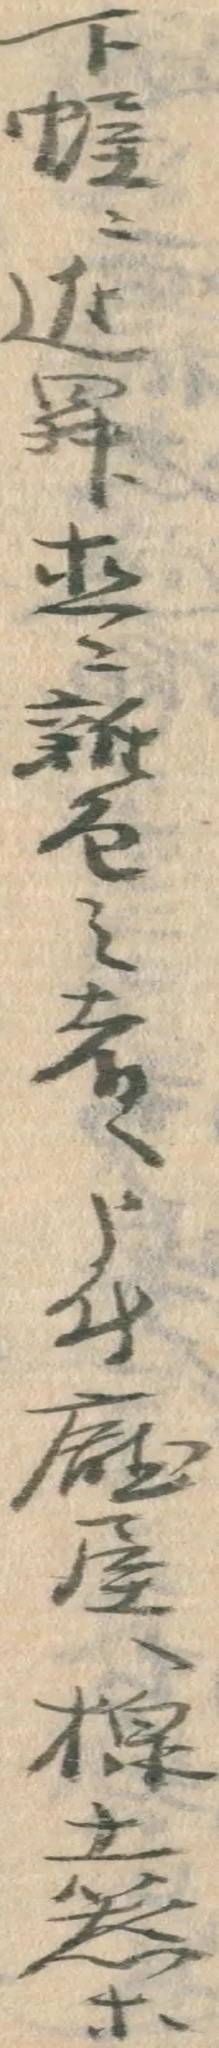下幄ニ進昇、直ニ雑色之者へ申付、廳屋へ楾・土器等
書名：賀茂社記録. 第63冊
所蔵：国立国会図書館 National Diet Library, JAPAN
